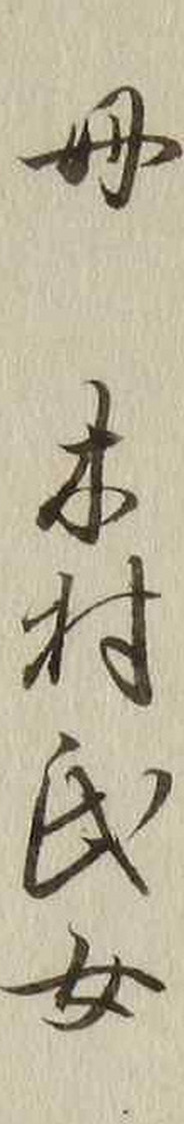母木村氏女
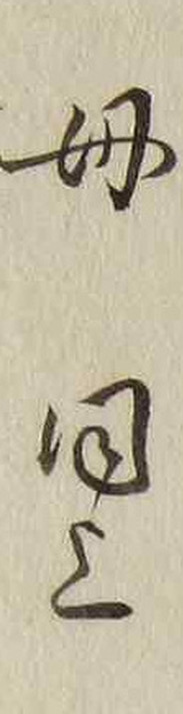母同上
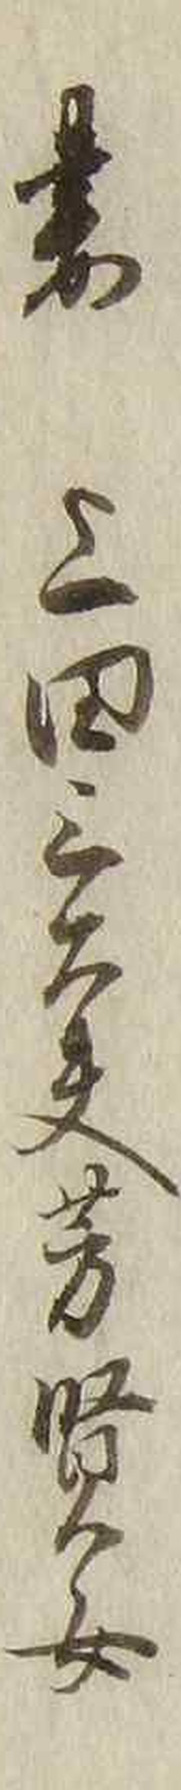妻上田三大夫芳賢女

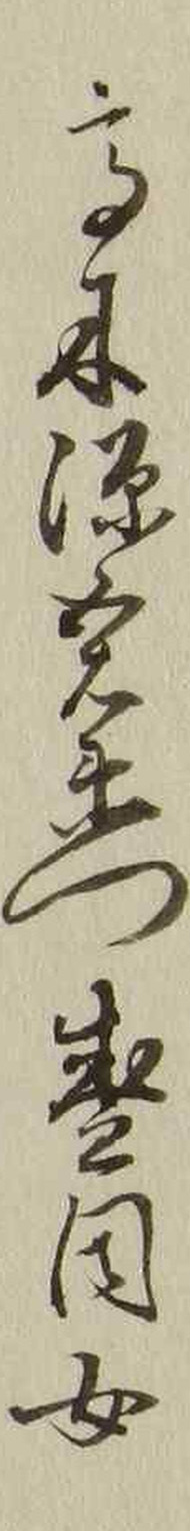高木源五右衛門盛周女
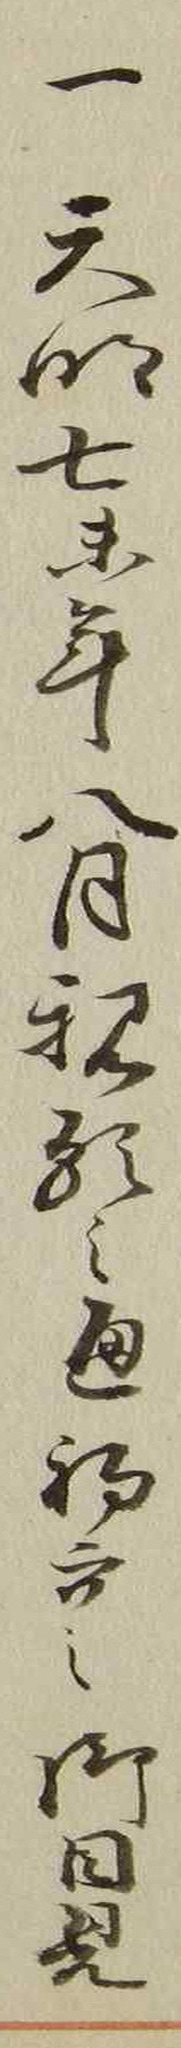一天明七未年八月親願之通初而之御目見
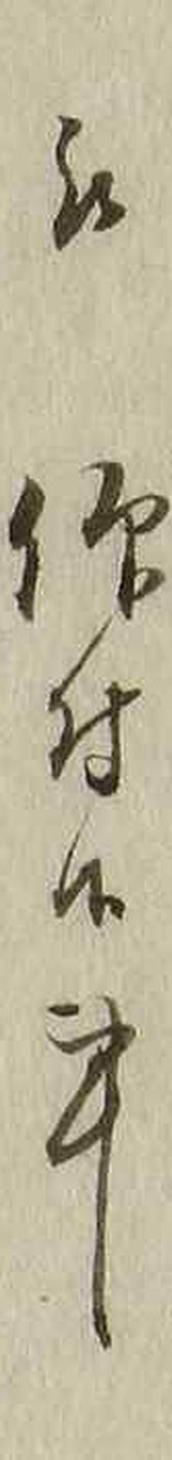被仰付候事
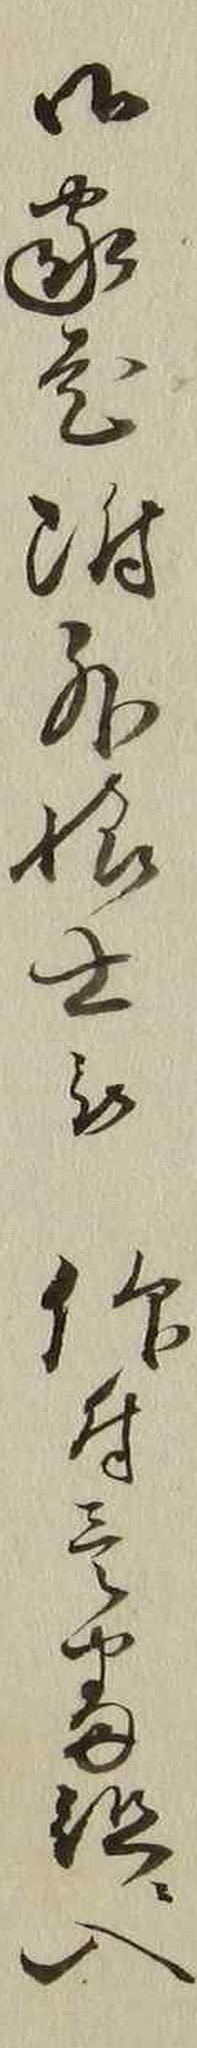御家老附外様士被仰付壱番組ニ入
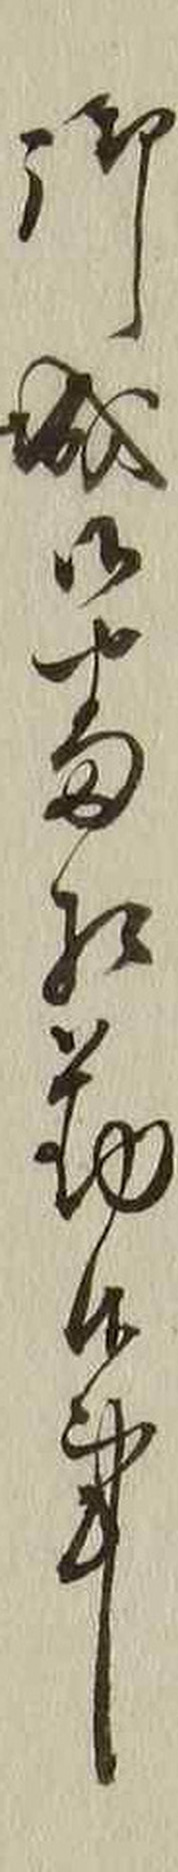御城御番相勤候事
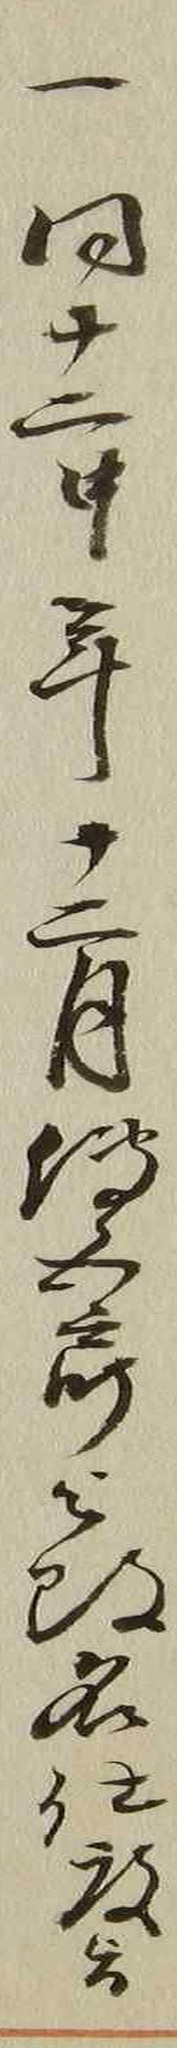一同十二申年十二月伝五郎与改名仕度旨
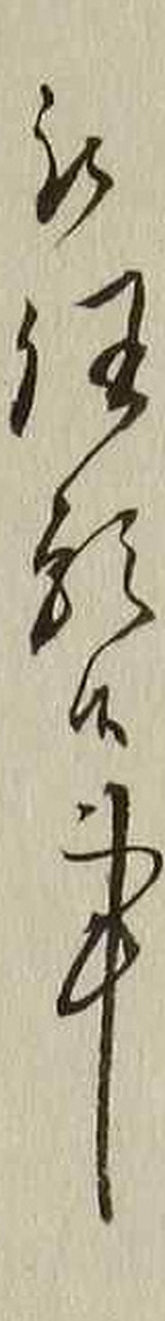被任願候事
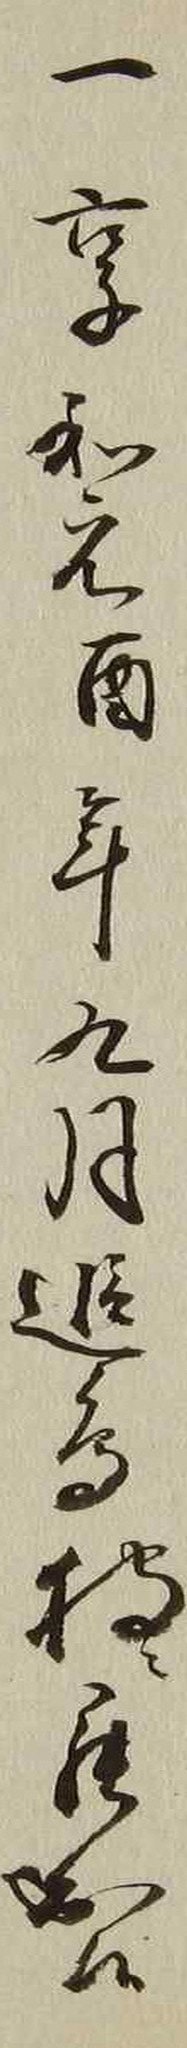一享和元酉年九月追鳥狩ニ罷出候
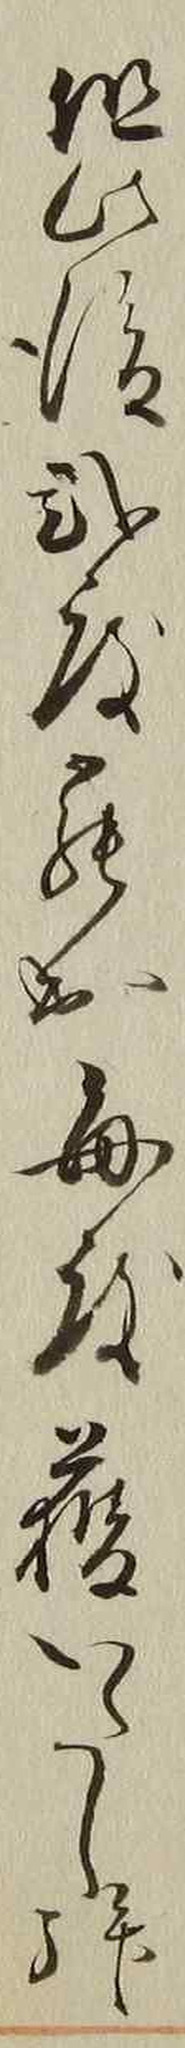但此後弐度罷出毎度獲いたし拝
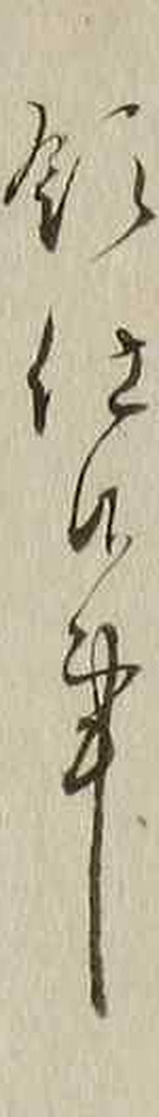領仕候事
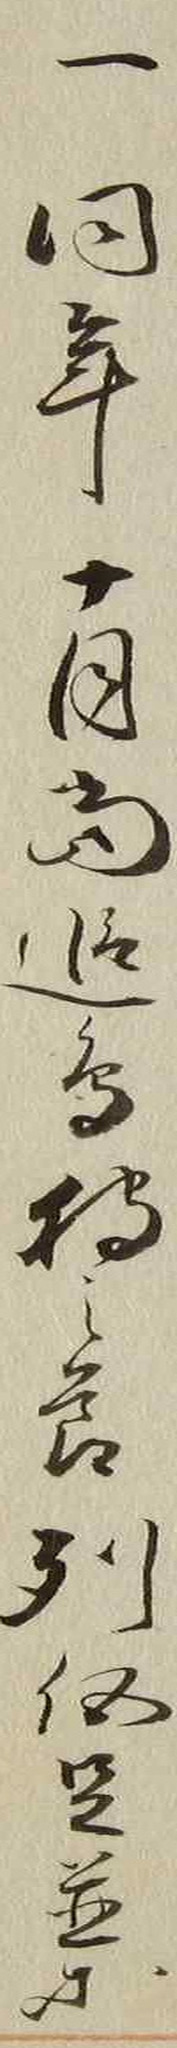一同年十月当追鳥狩之節列伍足並等
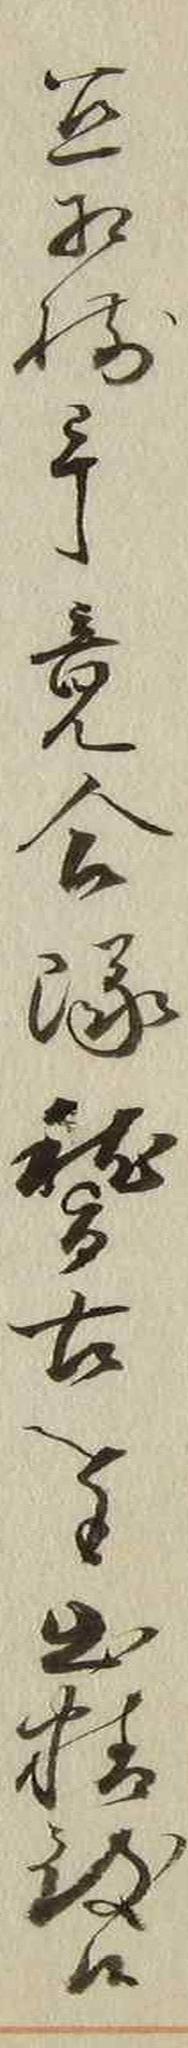宜相揃畢竟合隊稽古をも出精致候
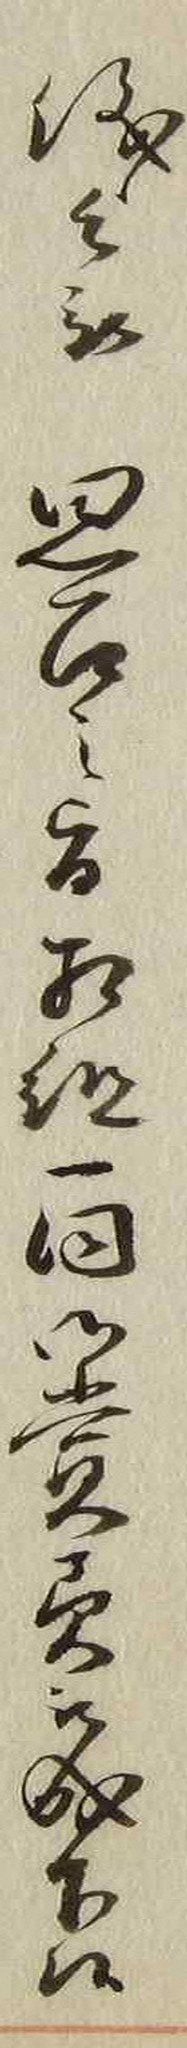儀与被思召之旨相組一同賞美被成下候
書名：諸士系譜　巻之122　よ之部5
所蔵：会津若松市立会津図書館
